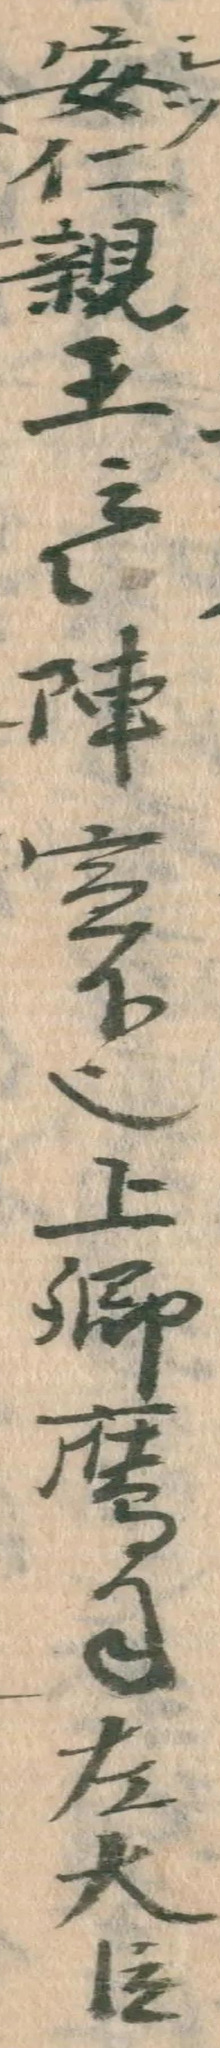安仁親王云々、陣宣下也、上卿鷹司左大臣
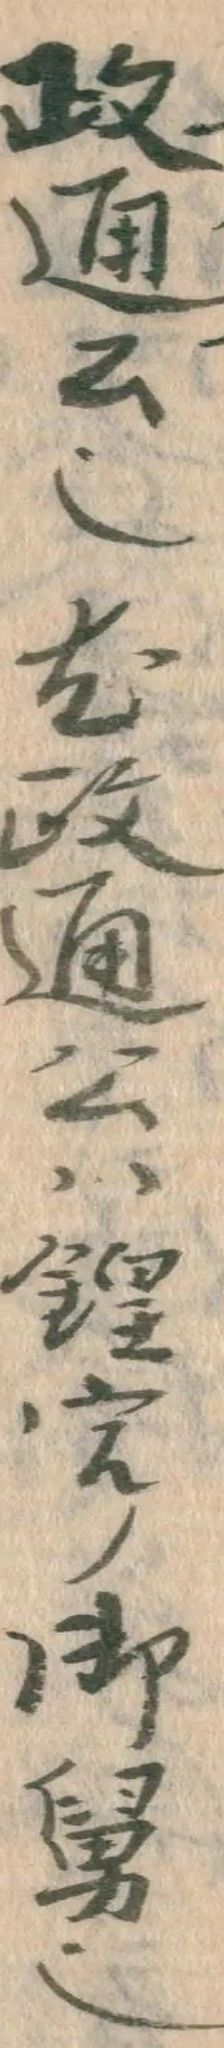政通公也、尤政通公ハ鍠宮ノ御舅也、
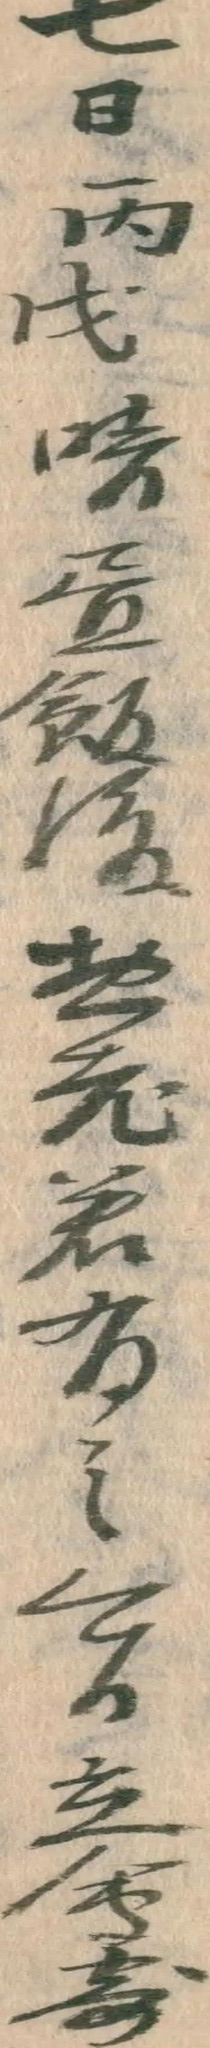七日丙戌晴、昼飯後惣老若有之、今日立會寄
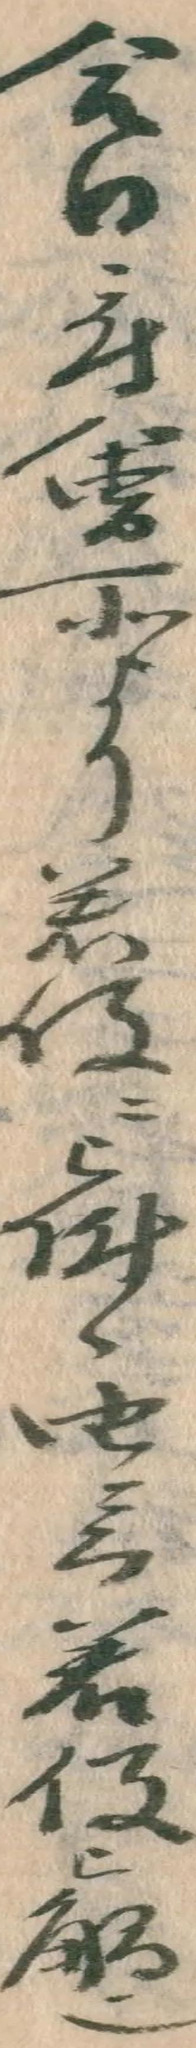合日ニ付、會所より若役ニ被附候由ニ而、若役被触也、
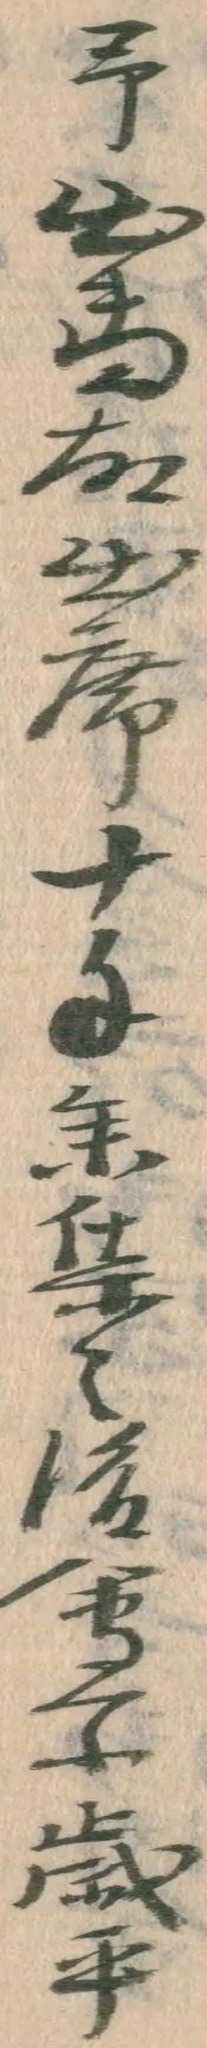予出番故出席、十手参集之後、會所歳平
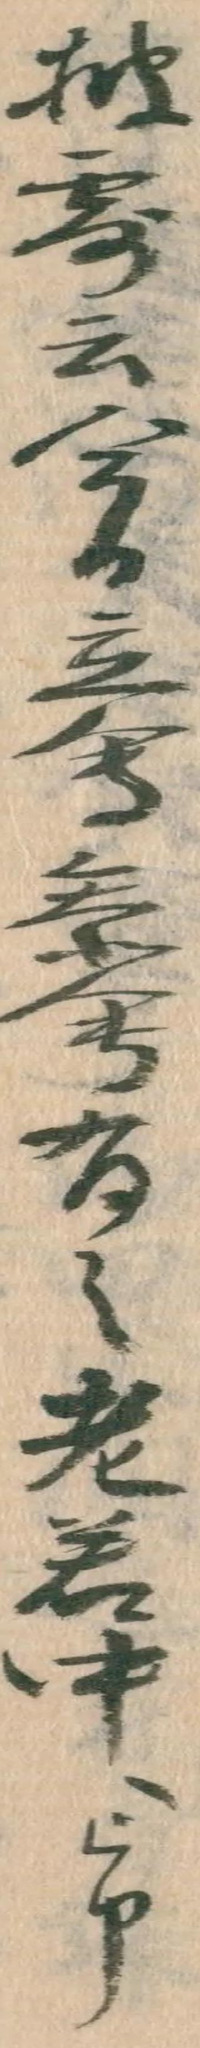披露云、今日立會参会有之、老若中へ被申
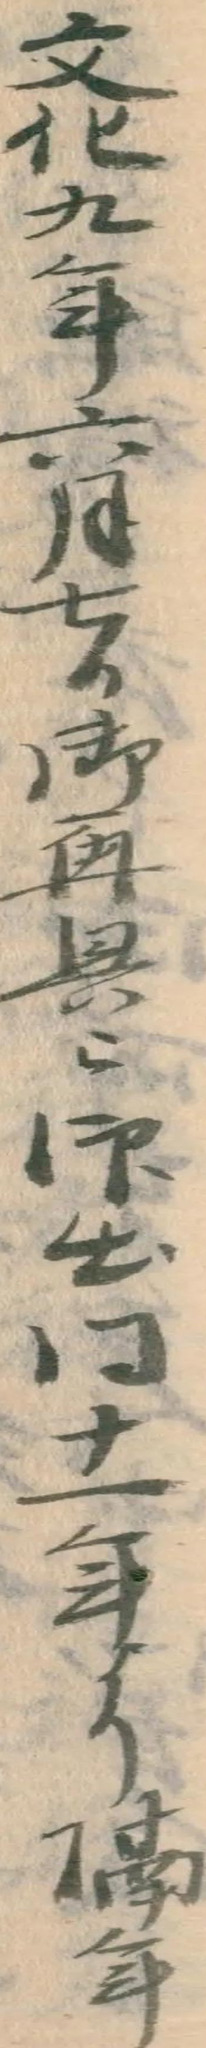文化九年六月七日御再興被仰出、同十一年より隔年
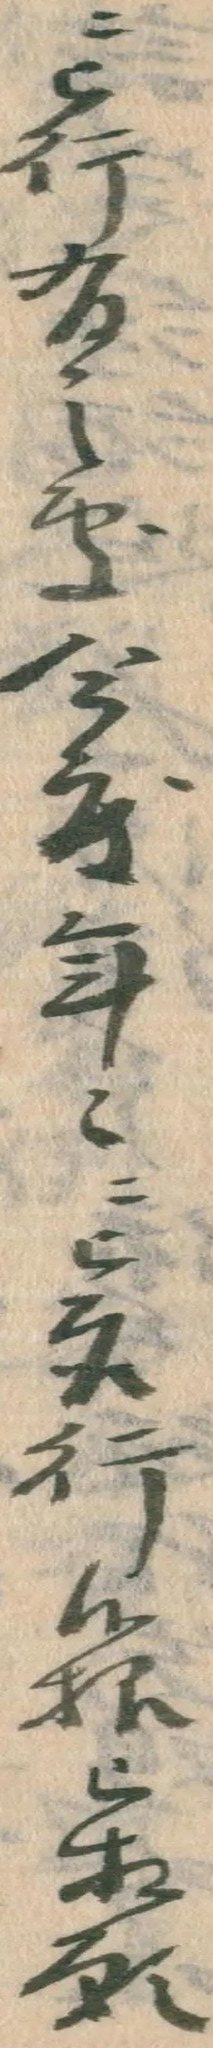ニ被行有之處、今度年々ニ被取行候様被相願
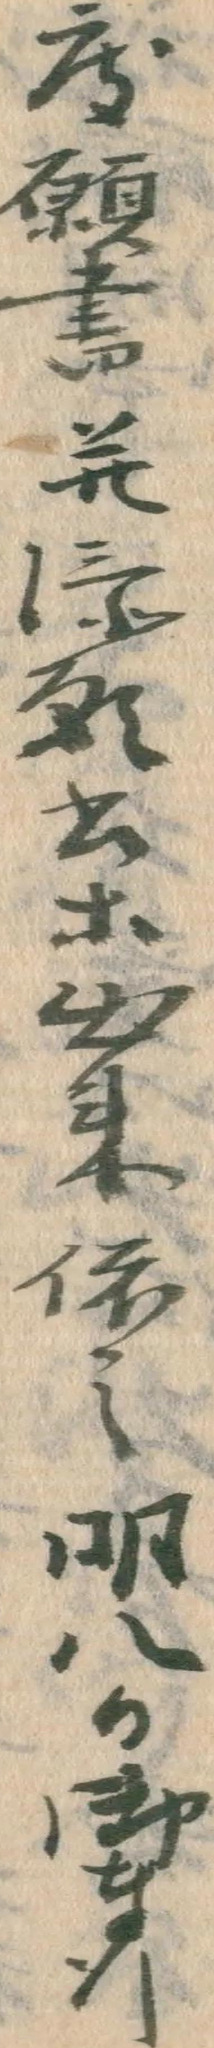度願書并添願書等出来、依之明八日御奉行
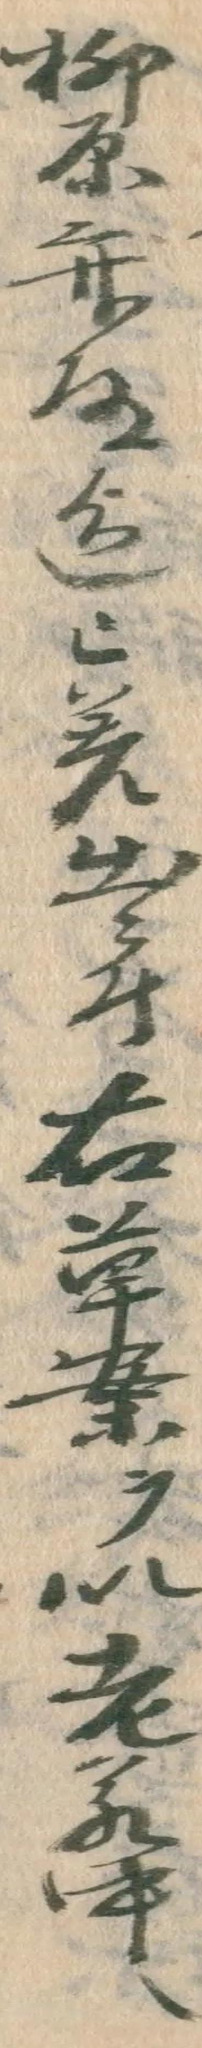柳原弁殿迄被差出ニ付、右草案ヲ以老若中へ
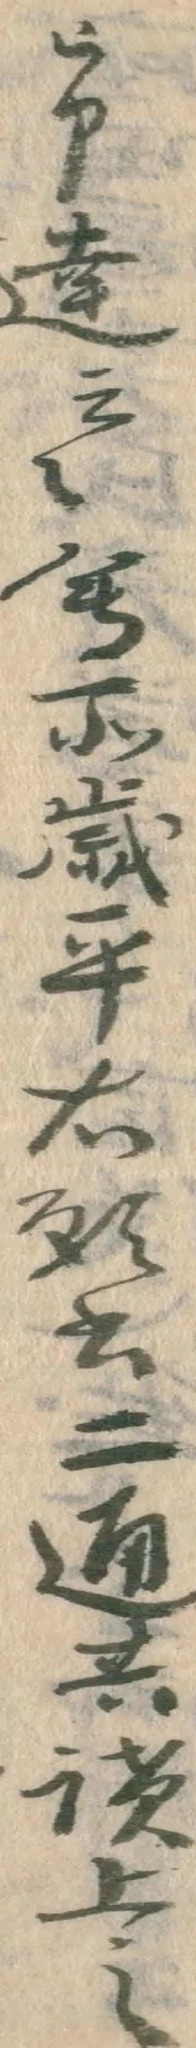被申達云々、會歳平右願書二通共読上之、
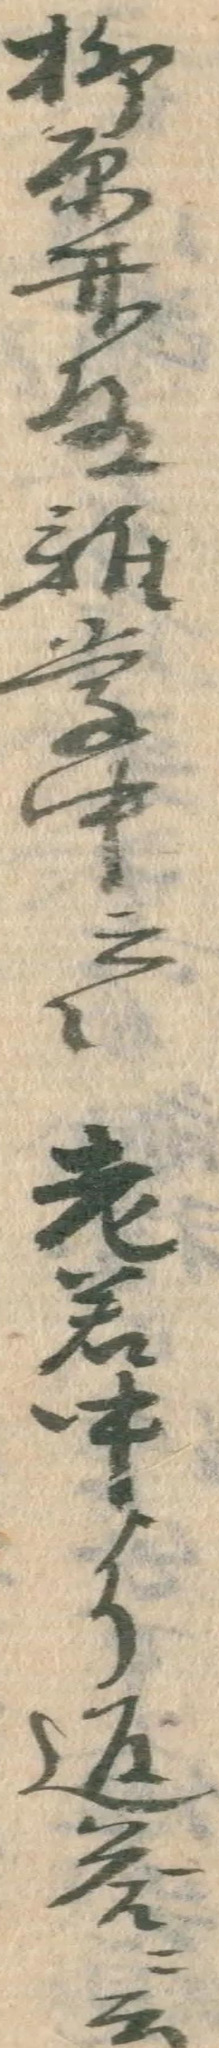柳原弁殿雑掌中云々、老若中より返答ニ云、
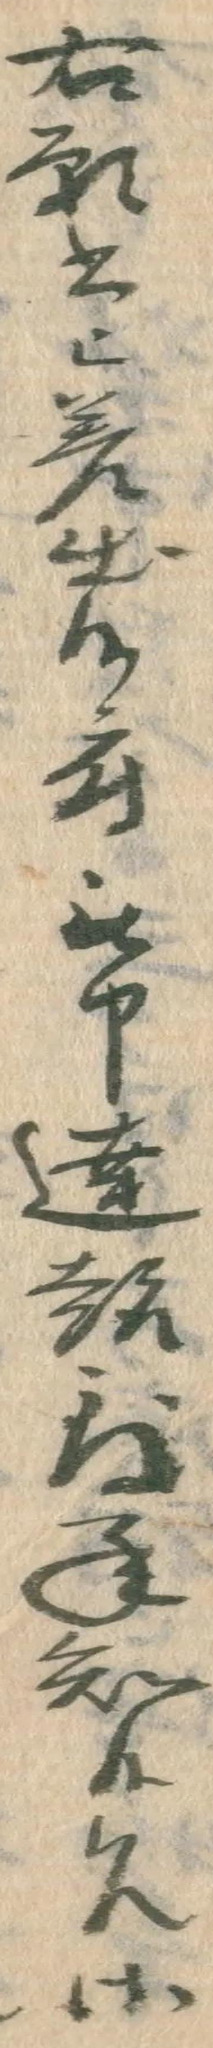右願書被差出候ニ付被申、達趣致承知候乍、御
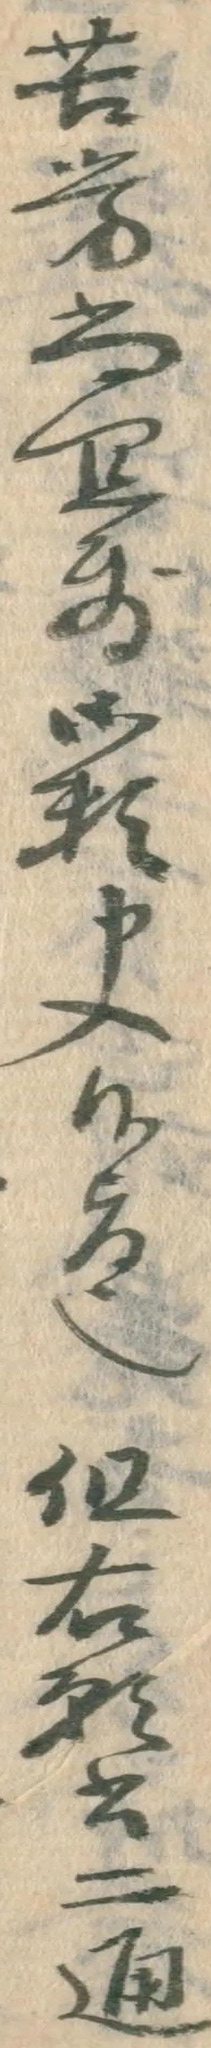苦労、尚宜敷御頼申入候旨也、但右願書二通
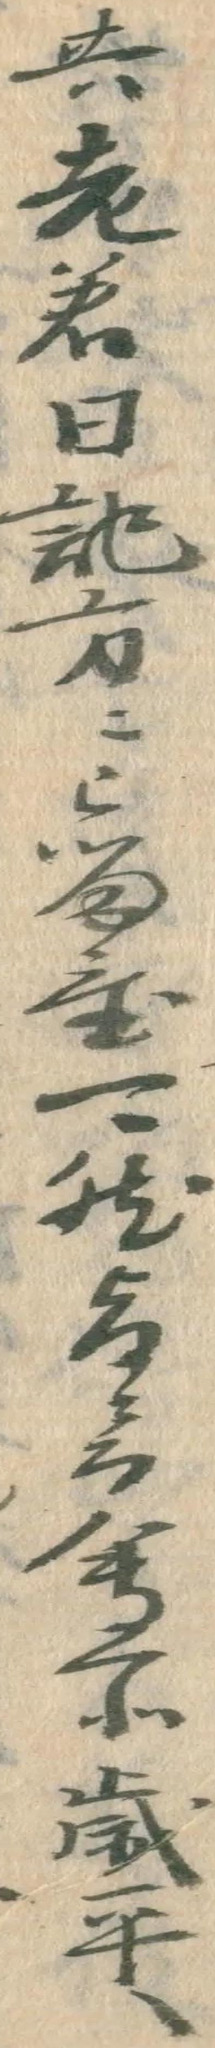共老若日記方ニ被留置、可然旨ニ而會所歳平へ
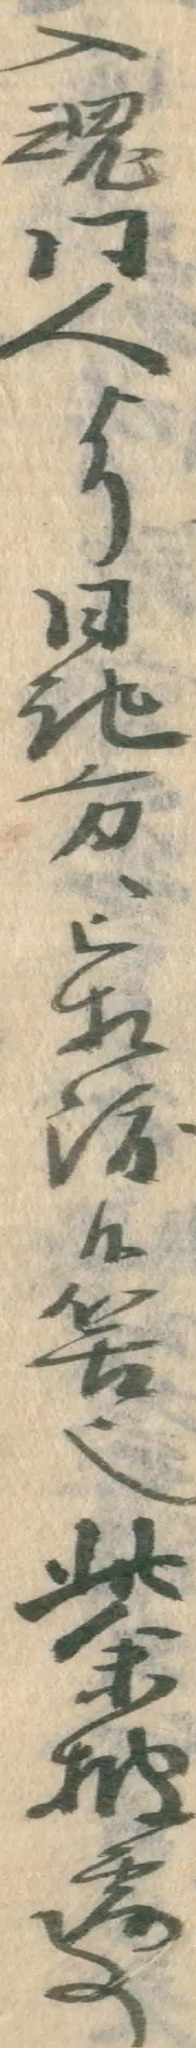入魂同人より日記方へ被相渡候筈也、此余披露事、
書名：賀茂社記録. 第63冊
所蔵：国立国会図書館 National Diet Library, JAPAN
